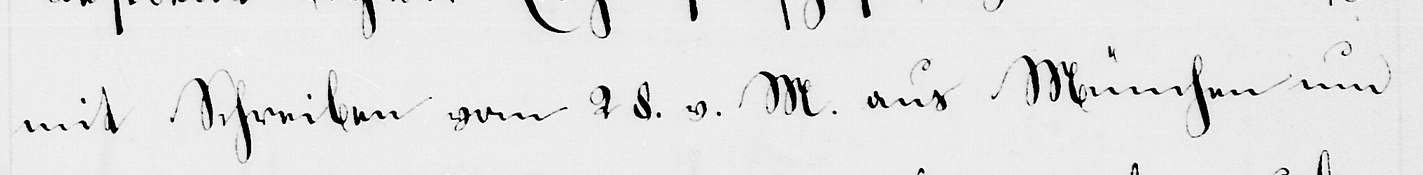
mit Schreiben vom 28. v. M. aus München um
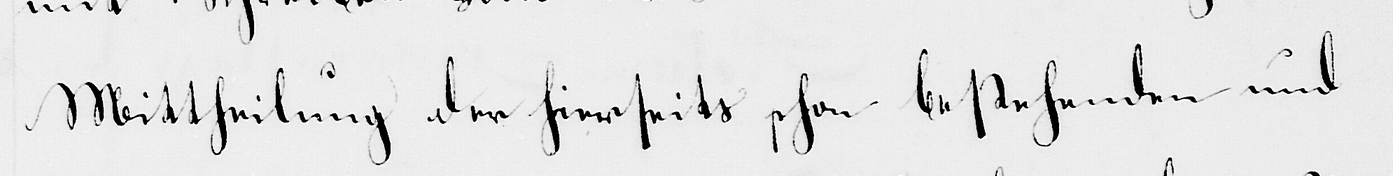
Mittheilung der hierseits schon bestehenden und
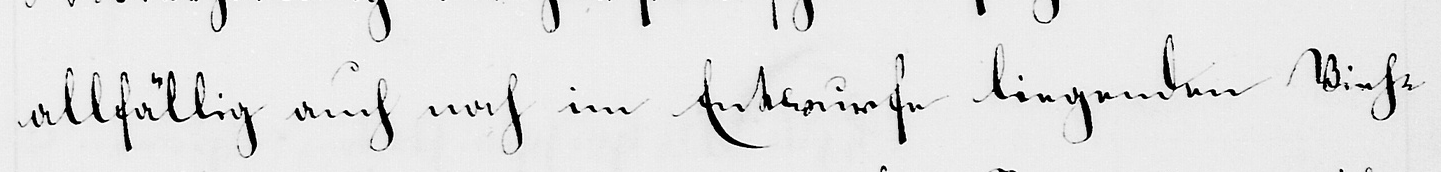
allfällig auch noch im Entwurf liegenden Vieh¬
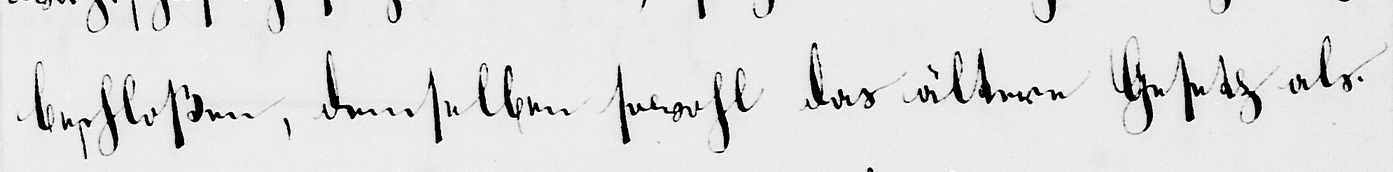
beschloßen, demselben sowohl das ältere Gesetz als
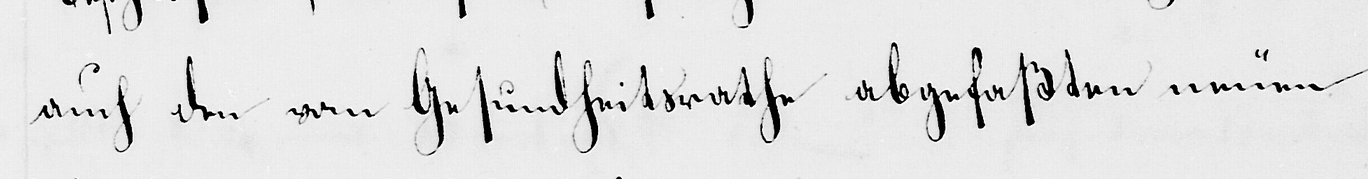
auch den vom Gesundheitsrathe abgefaßten neuen
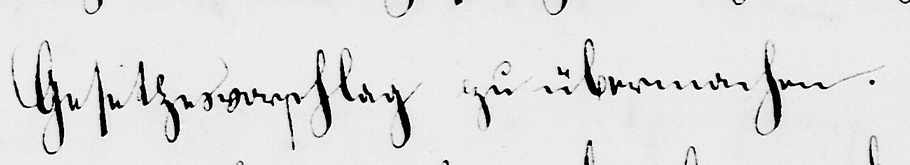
Gesetzesvorschlag zu übermachen.
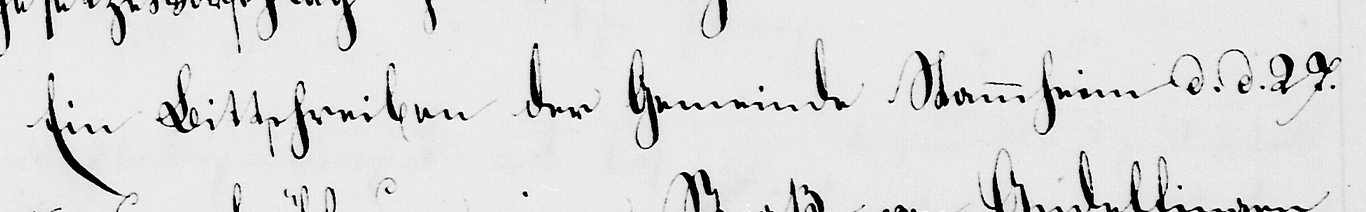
Ein Bittschreiben der Gemeinde Stammheim d. d. 27.
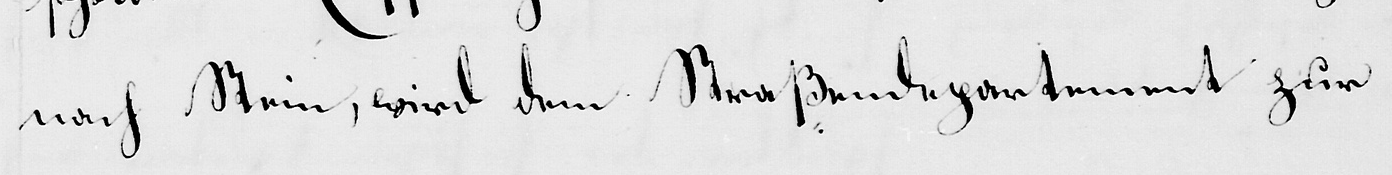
nach Stein, wird dem Straßendepartement zur
